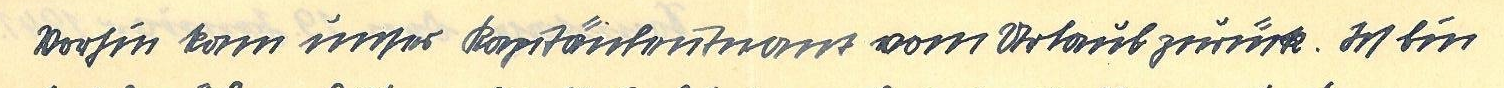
Vorhin kam unser Kapitänleutnant vom Urlaub zurück. Ich bin
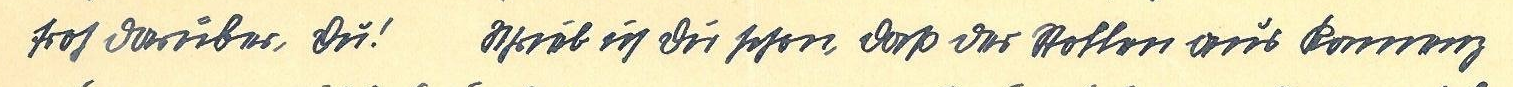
froh darüber, Du! Schrieb ich Dir schon, daß der Stollen aus K.
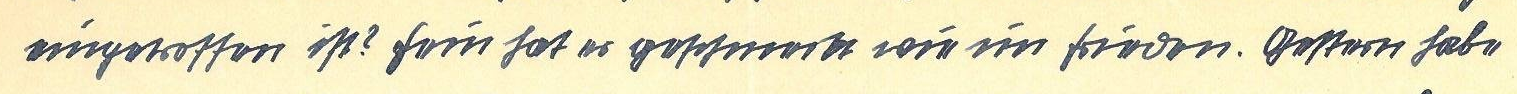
eingetroffen ist? Fein hat er geschmeckt wie im Frieden. Gestern habe
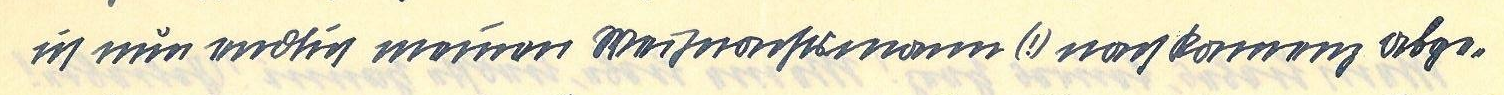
ich nun endlich meinen Weihnachtsmann (!) nach K. abge¬
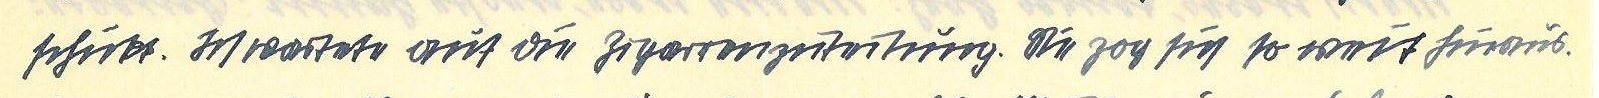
schickt. Ich wartete auf die Zigarrenzuteilung. Sie zog sich so weit hinaus.
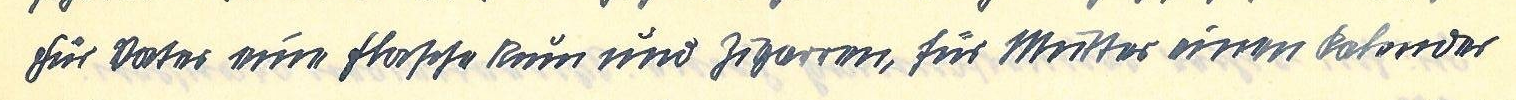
Für Vater eine Flasche Rum und Zigarren, für Mutter einen Kalender
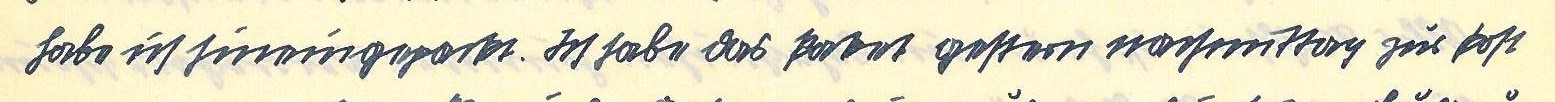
habe ich hineingepackt. Ich habe das Paket gestern nachmittag zur Post
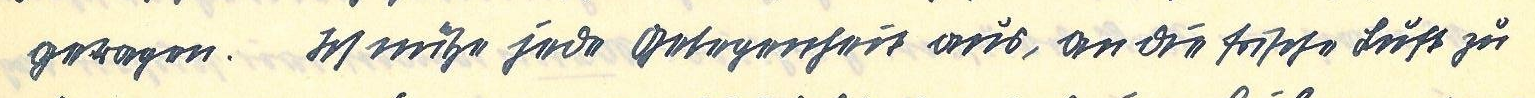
getragen. Ich nütze jede Gelegenheit aus, an die frische Luft zu
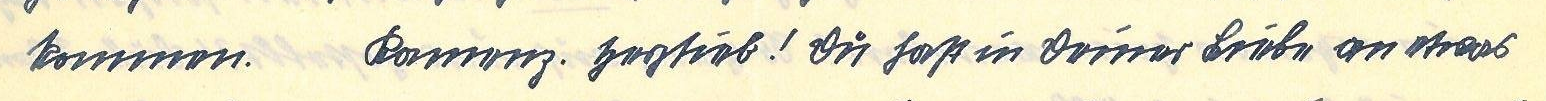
kommen. K. Herzlieb! Du hast in Deiner Liebe an etwas
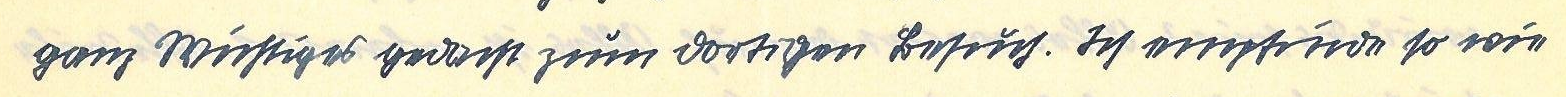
ganz Wichtiges gedacht zum dortigen Besuch. Ich empfinde so wie
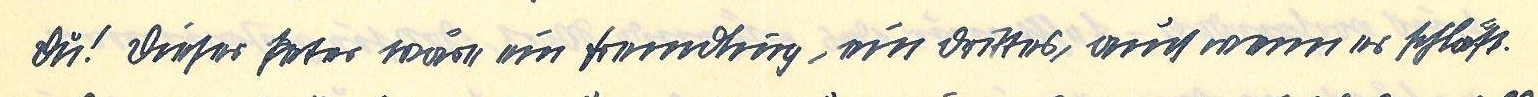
Du! Dieser P. wäre ein Fremdling, ein drittes, auch wenn er schläft.
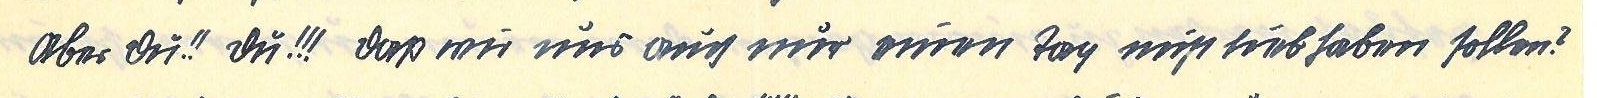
Aber Du!! Du!!! Daß wir uns auch nur einen Tag nicht lieb haben sollen?
